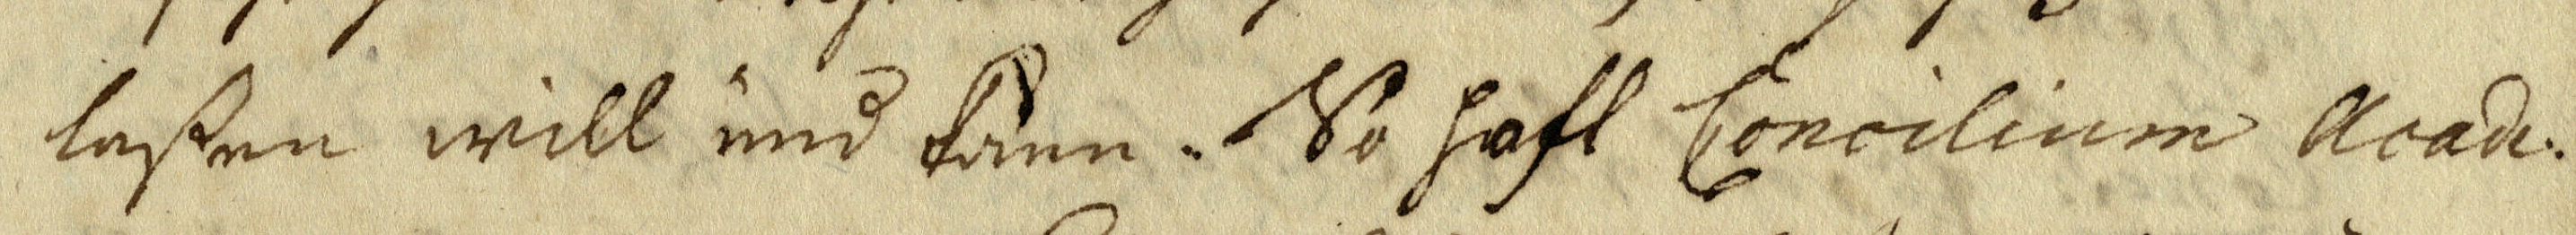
laßen will und kann. So hoft Concilium Acade¬
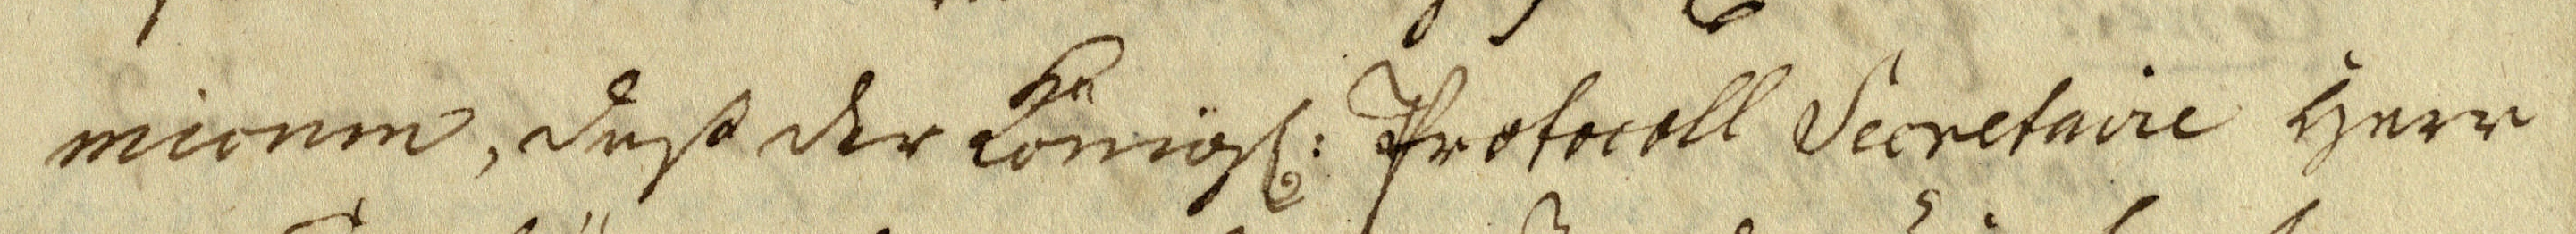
micum, daß der Königl. Protocoll Secretaire Herr
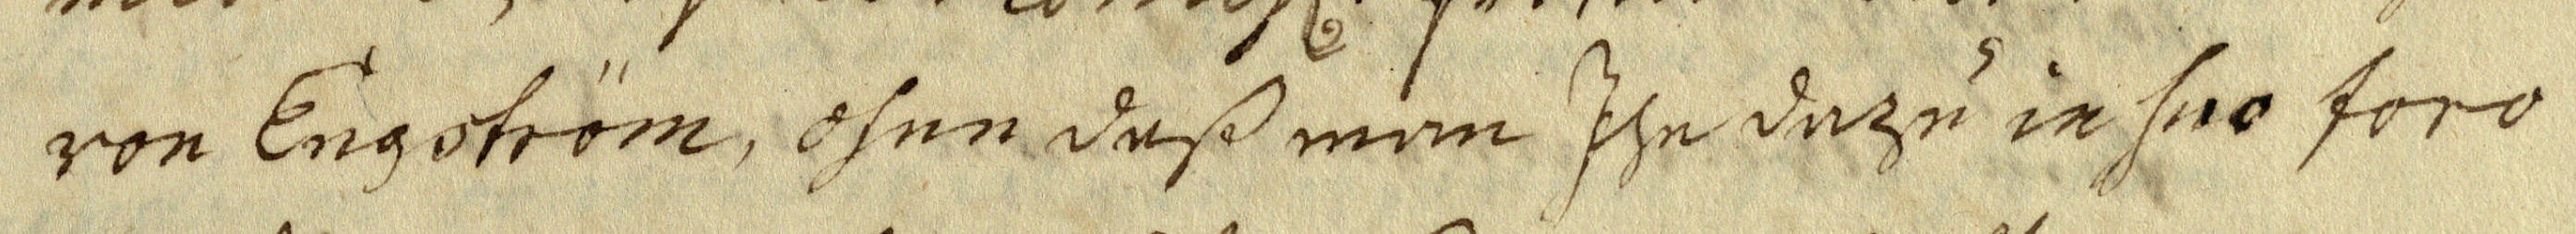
von Engström, ohne daß man Ihn dazu in suo foro
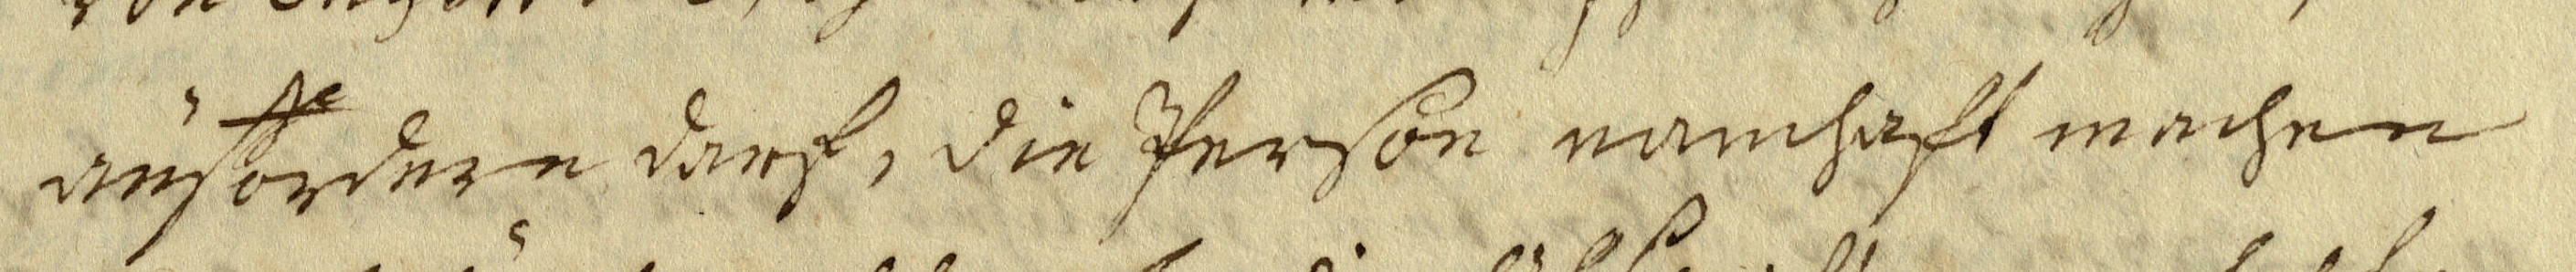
auffordern darf, die Person namhaft machen
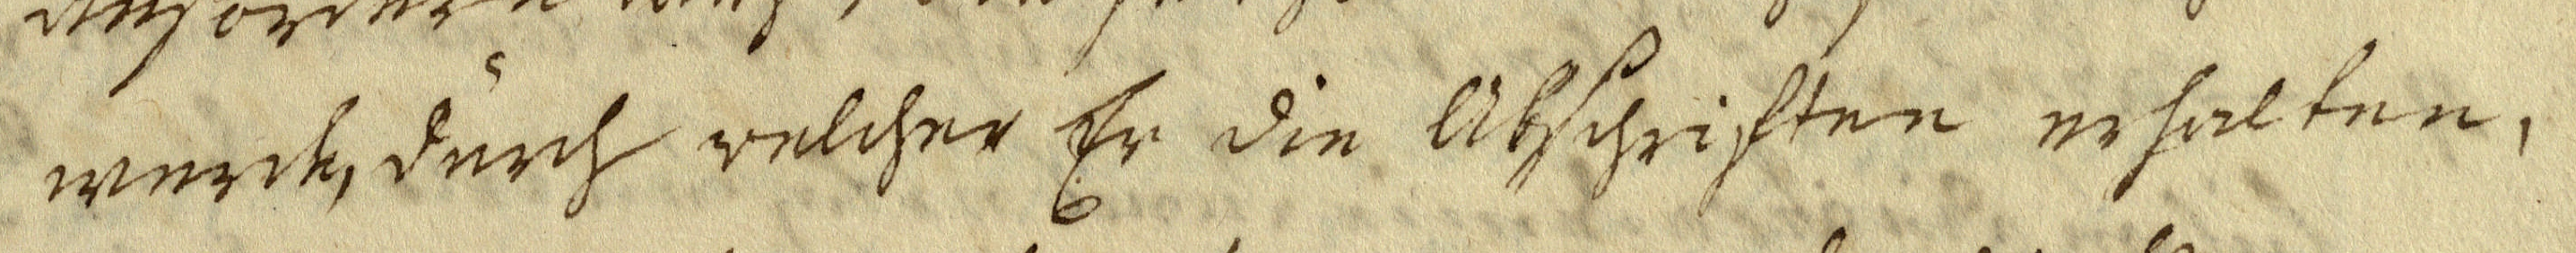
werde, durch welcher Er die Abschriften erhalten,
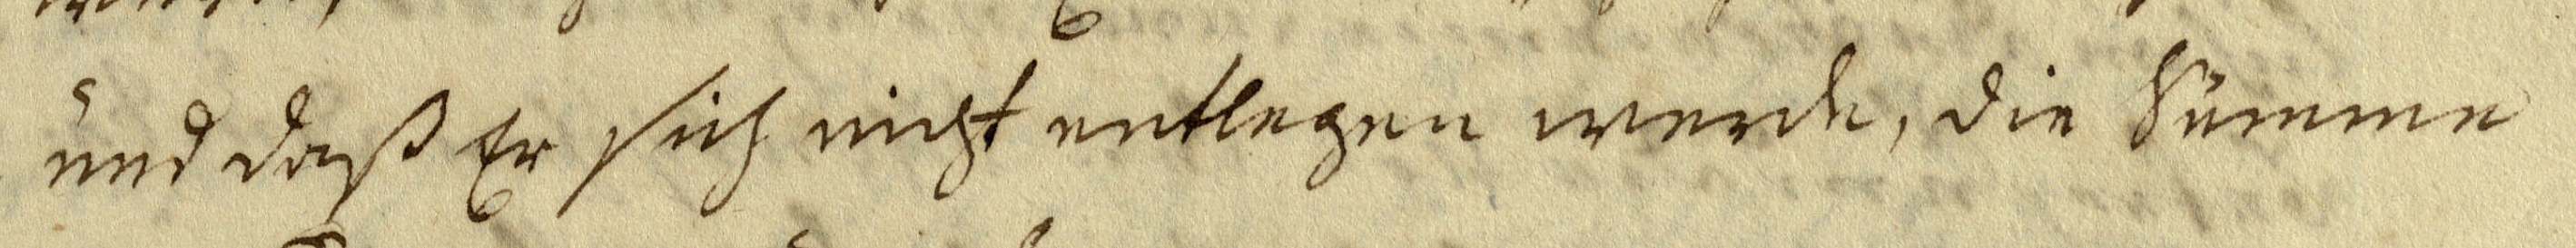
und daß Er sich nicht entlegen werde, die Summe
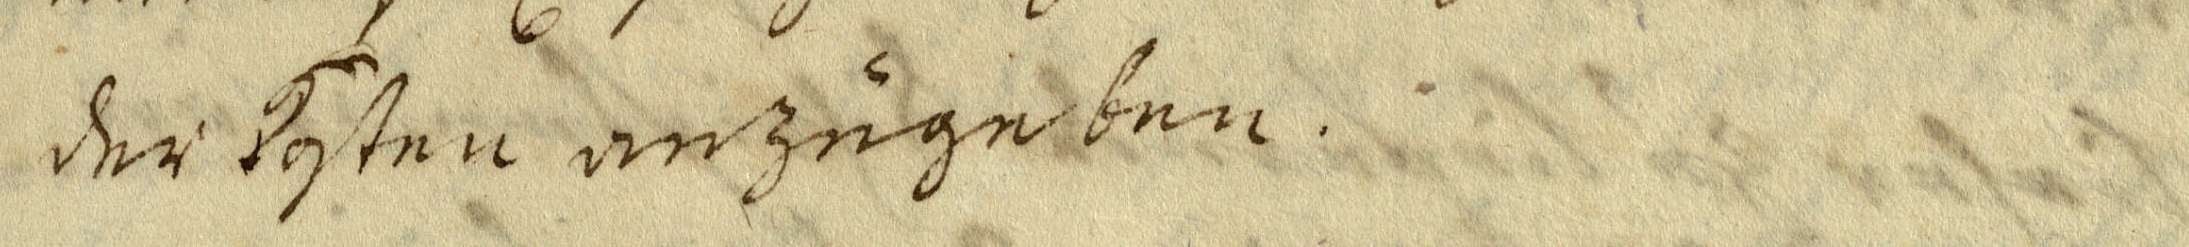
der Kosten anzugeben.
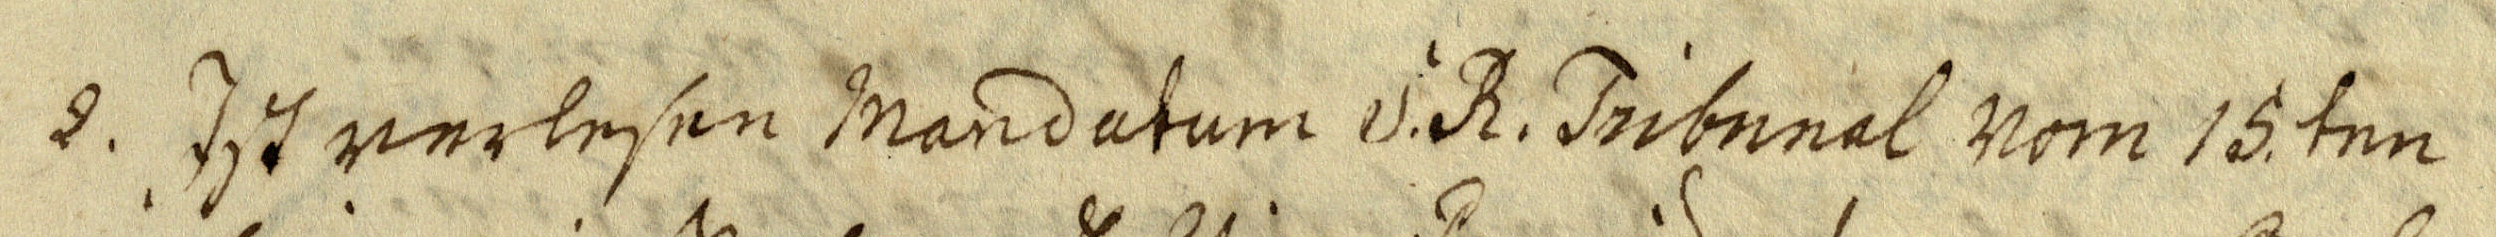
2. Ist verlesen Mandatum S. R. Tribunal vom 15 ten
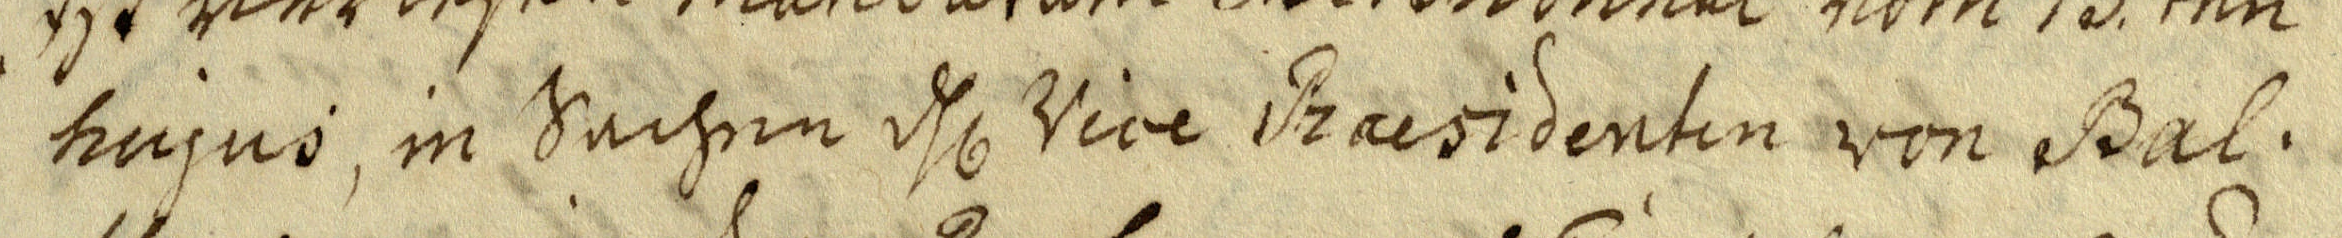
hujus, in Sachen dh Vice Praesidenten von Bal¬
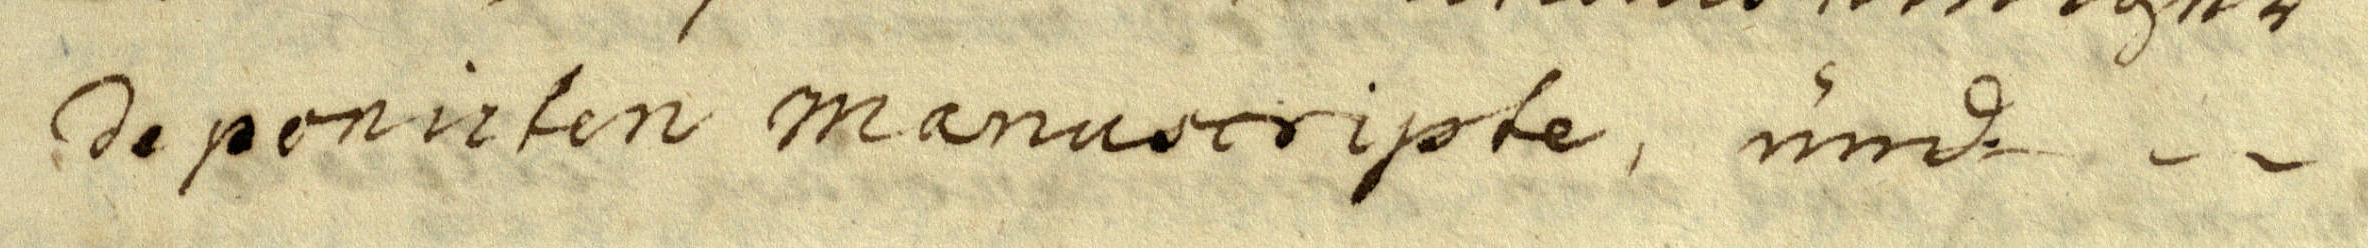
thasar, wieder Rectorem et Concilium Acad.
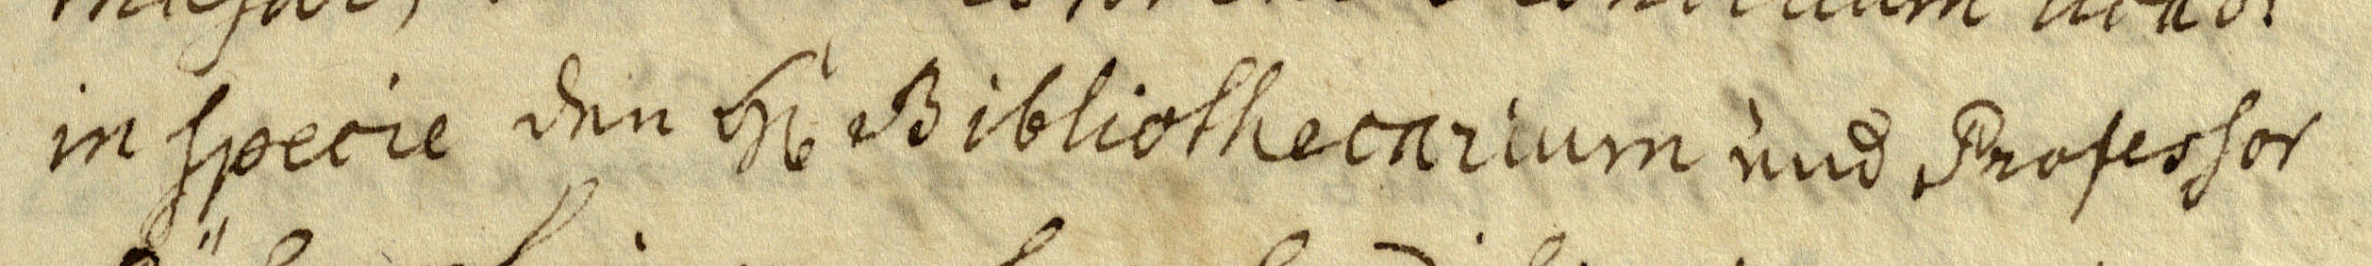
in specie den H Bibliothecarium und Professor
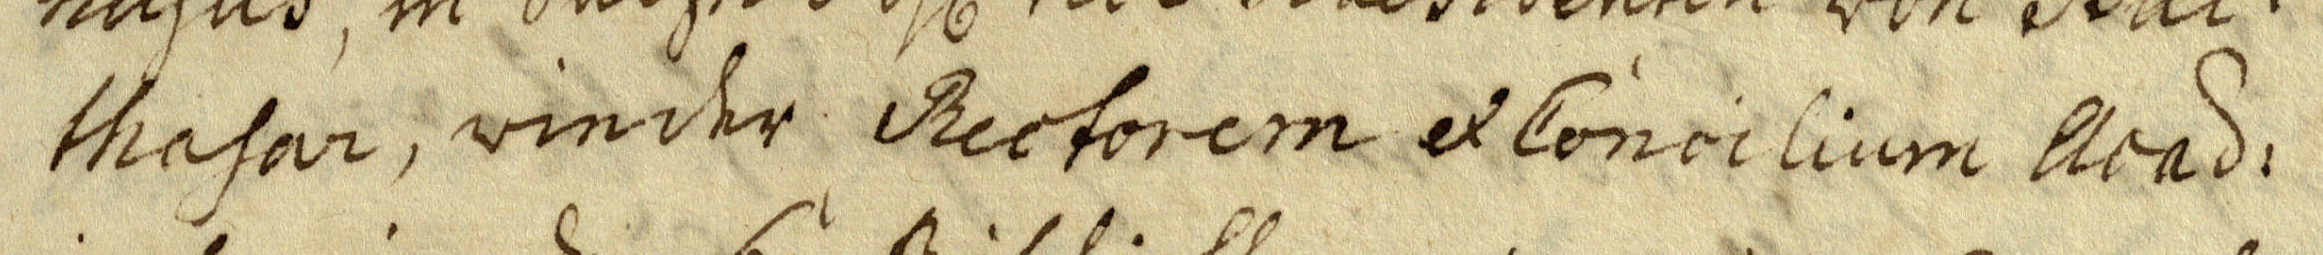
Dähnert, in puncto retraditionis einiger
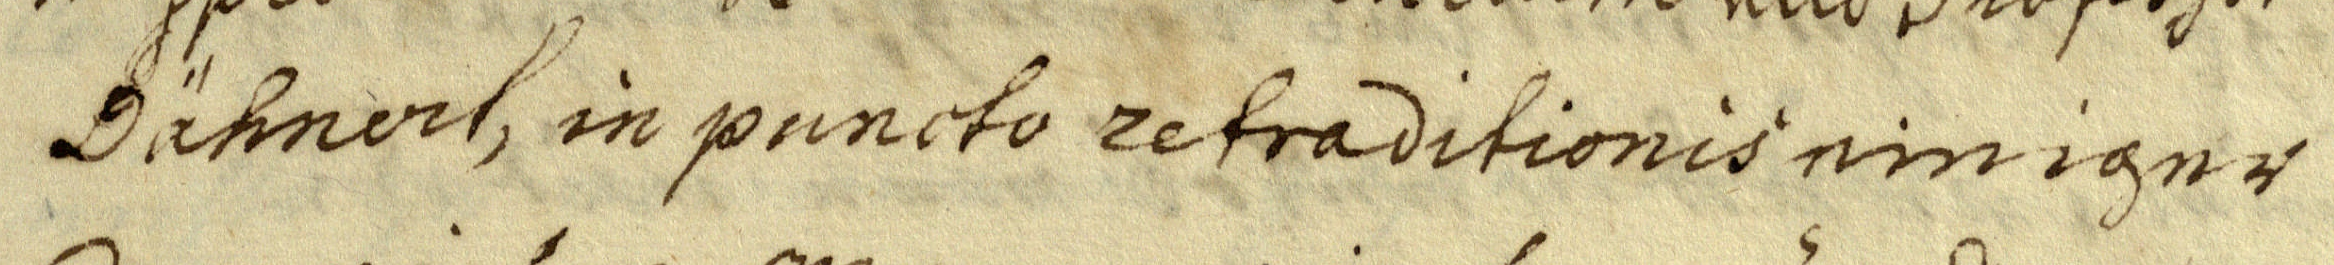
deponirten Manuscripte, und
